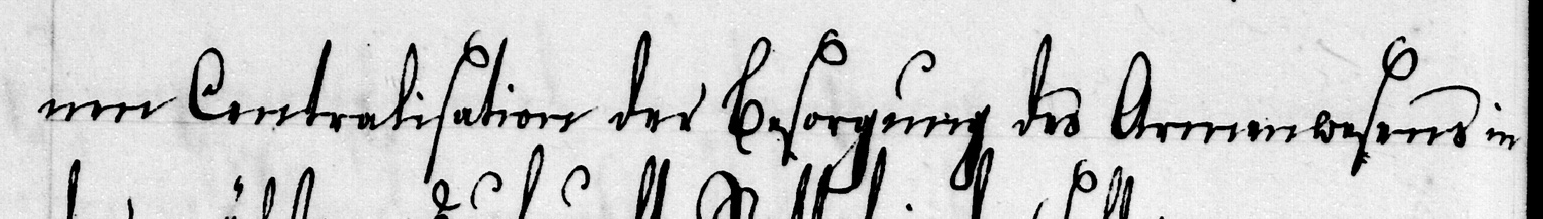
nen Centralisation der Besorgung des Armenwesens in
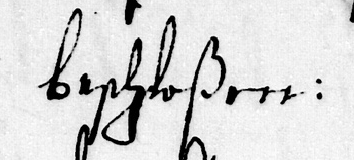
beschloßen:
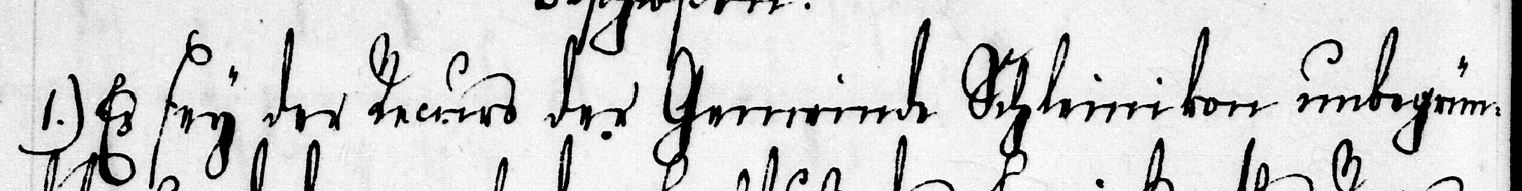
1.) Es sey der Recurs der Gemeinde Schleinikon unbegrün¬
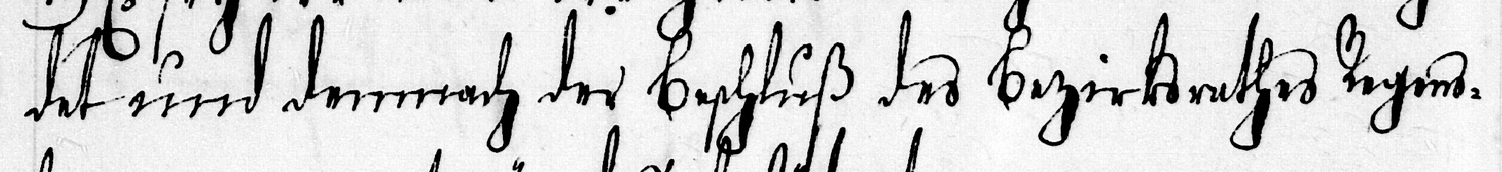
det und demnach der Beschluß des Bezirksrathes Regens¬
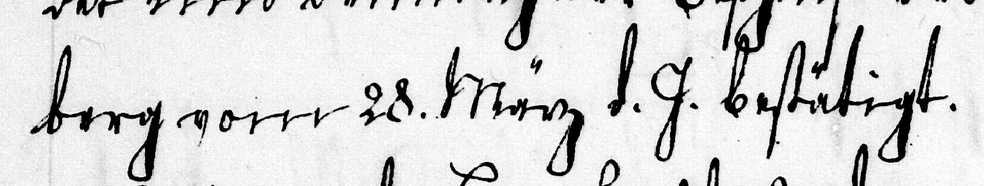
berg vom 28. März d. J. bestätigt.
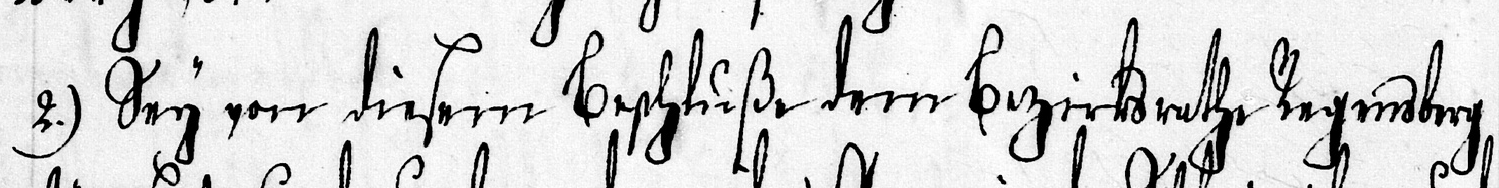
2.) Sey von diesem Beschluße dem Bezirksrathe Regensberg
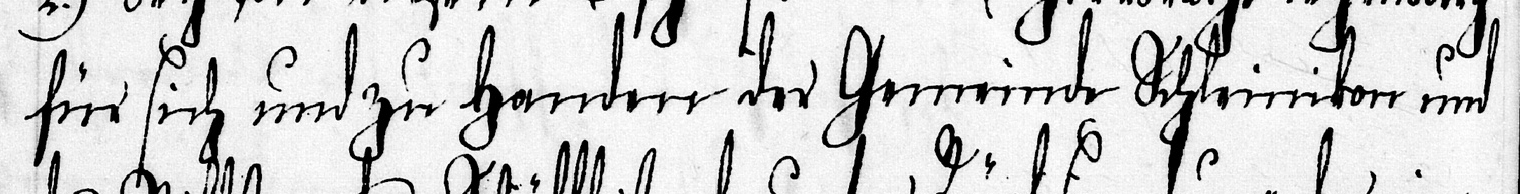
für sich und zu Handen der Gemeinde Schleinikon und
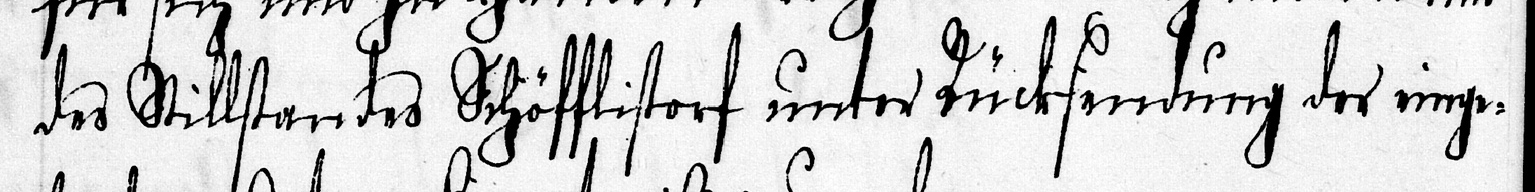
des Stillstandes Schöfflistorf unter Rücksendung der einge¬
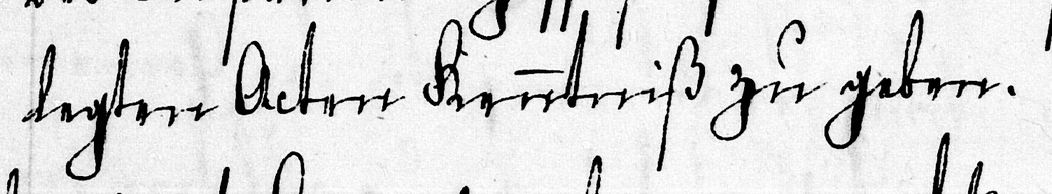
legten Acten Kenntniß zu geben.
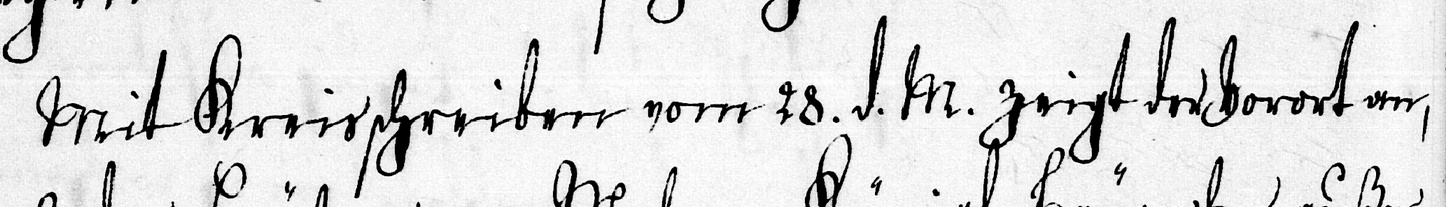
Mit Kreisschreiben vom 28. d. M. zeigt der Vorort an,
